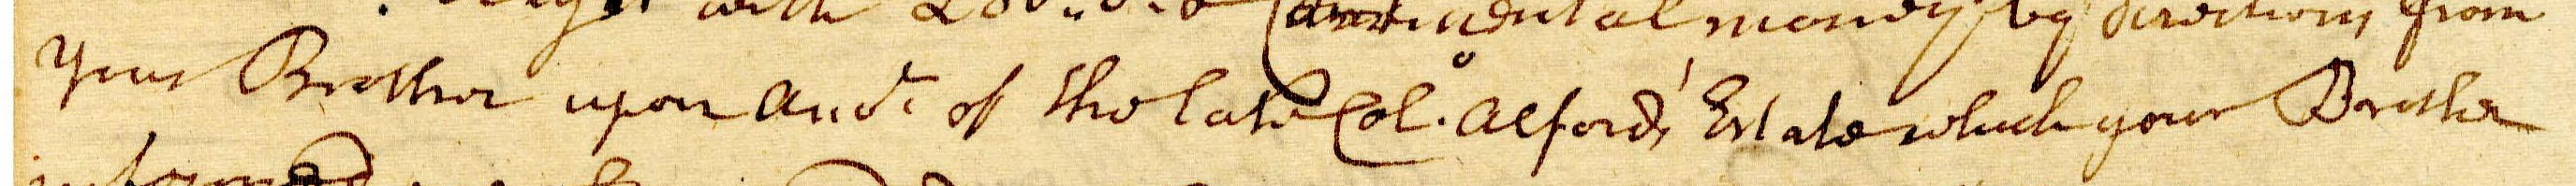Your Brother upon Acco^t. of the late Col^o. Alfords Estate which your Brother
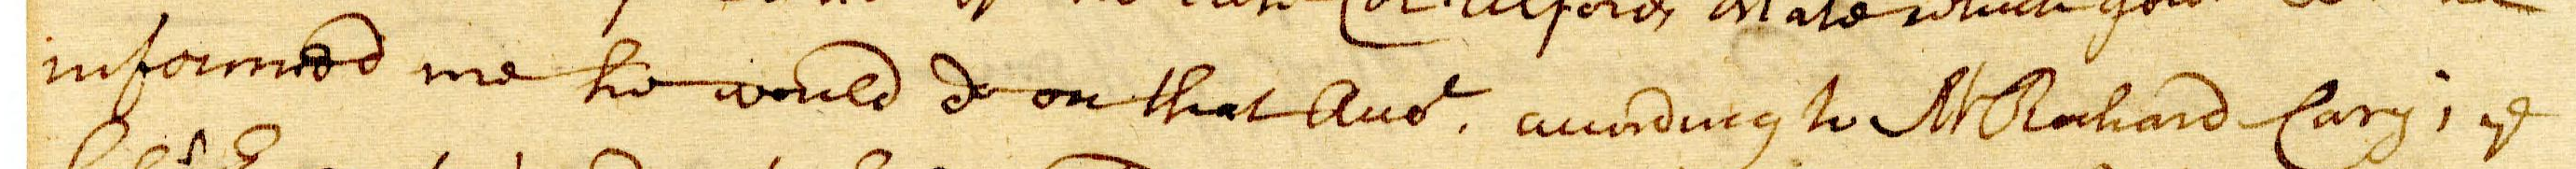informed me he would do on that Acco^t. according to MrRichard Cary; y^e
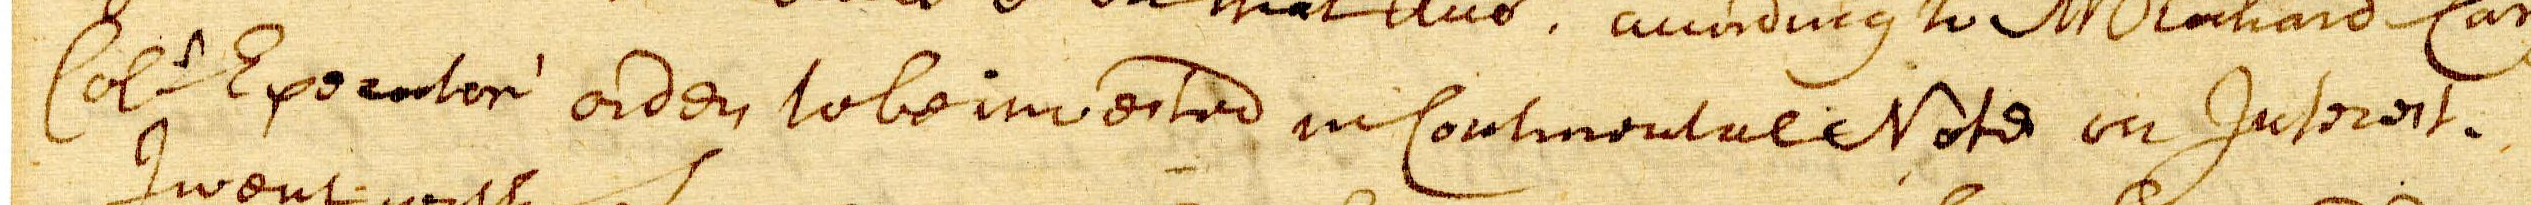Col^s Executor order to be invested in Continental Note on Interest.
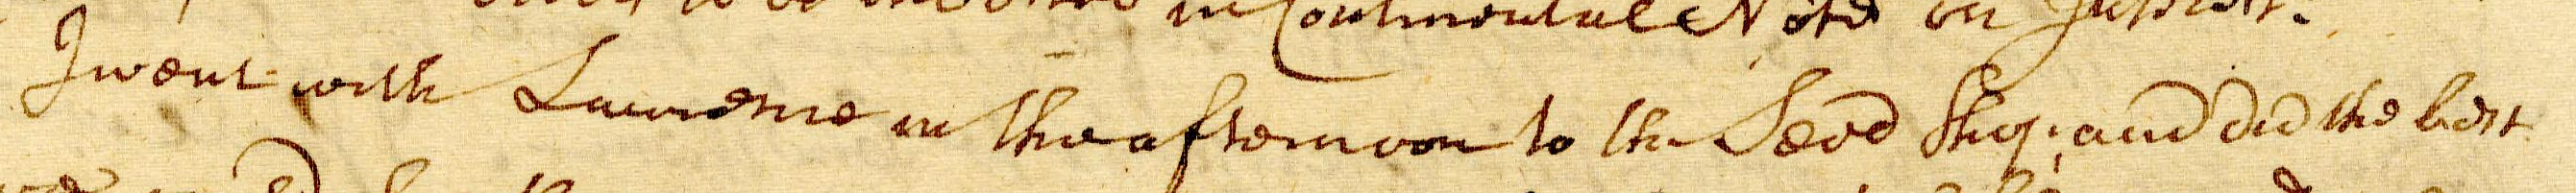I went with Lawrence in the afternoon to the Seed Shop; and did the best
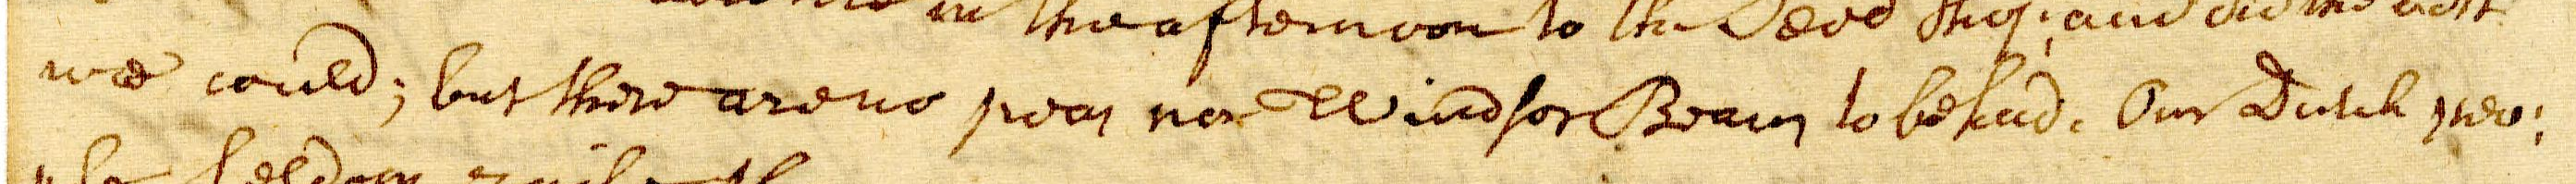we could; but there are no peas nor Windsor Beans to be had. Our Dutch peo-
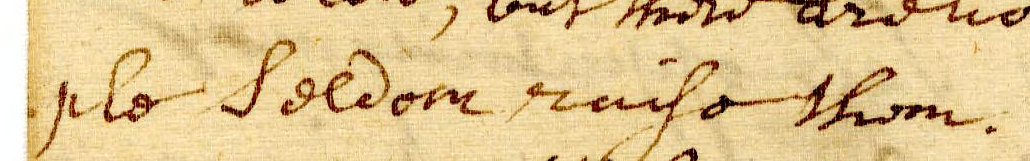ple Seldom raise them.
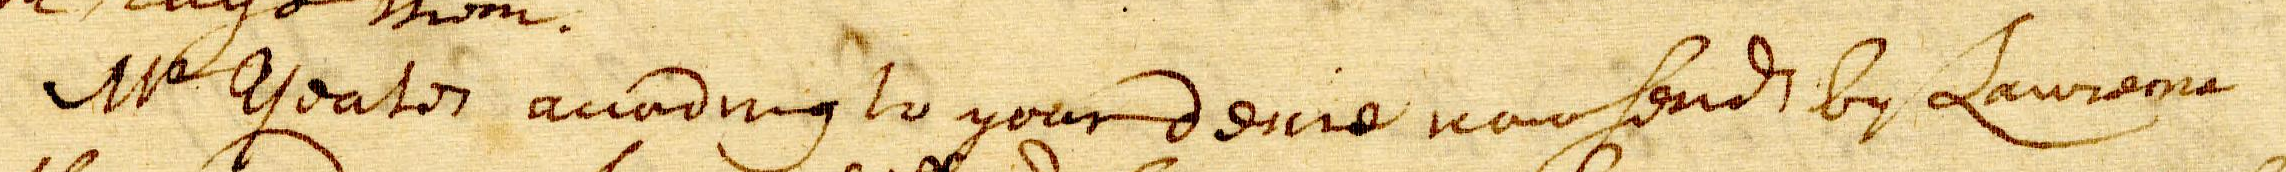M^r Yeates according to your desire now sends by Lawrence
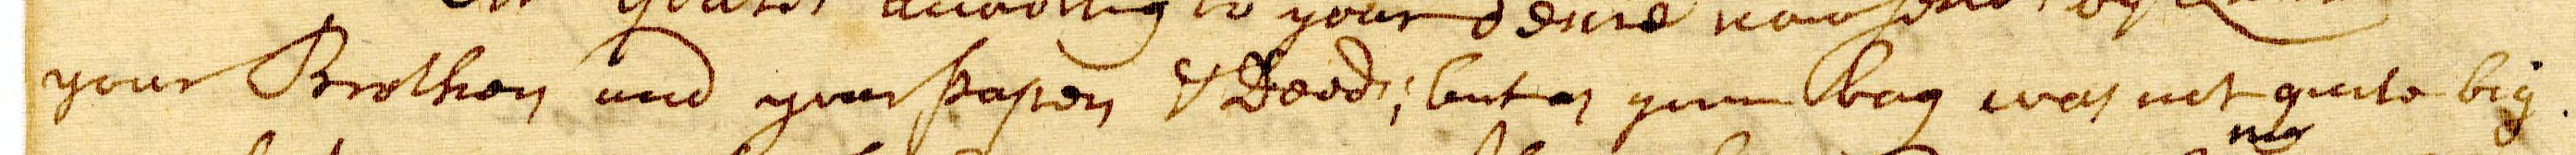your Brothers and your papers & Deeds; but as your bag was not quite big
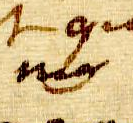my
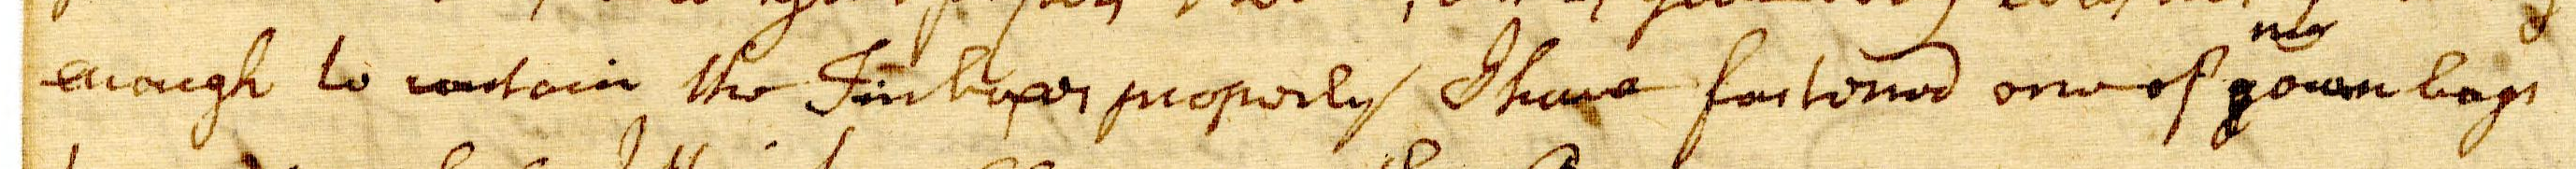enough to contain the Fir boxes properly I have fastened one of [_] own bags
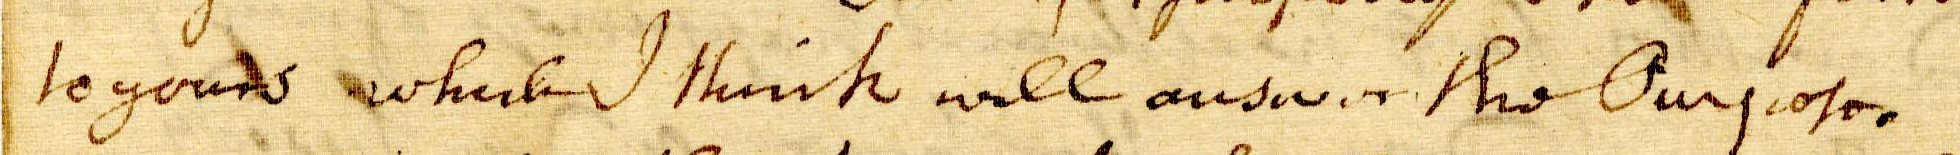to yours which I think will answer the Purpose.
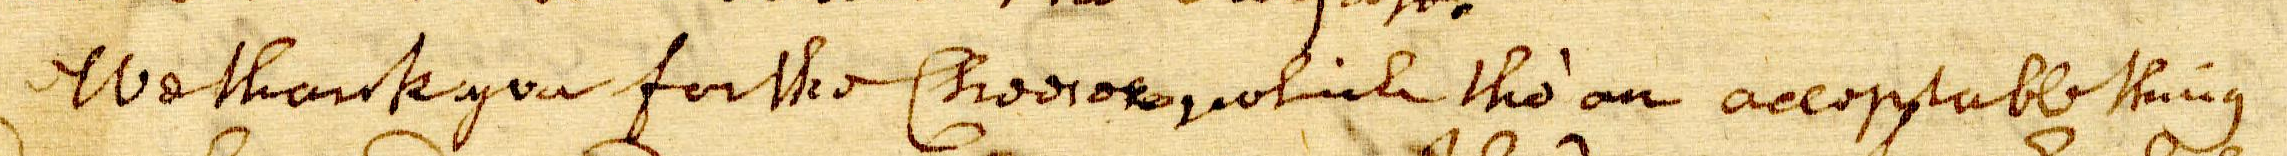We thank you for the Cheeses, which tho' an acceptable thing
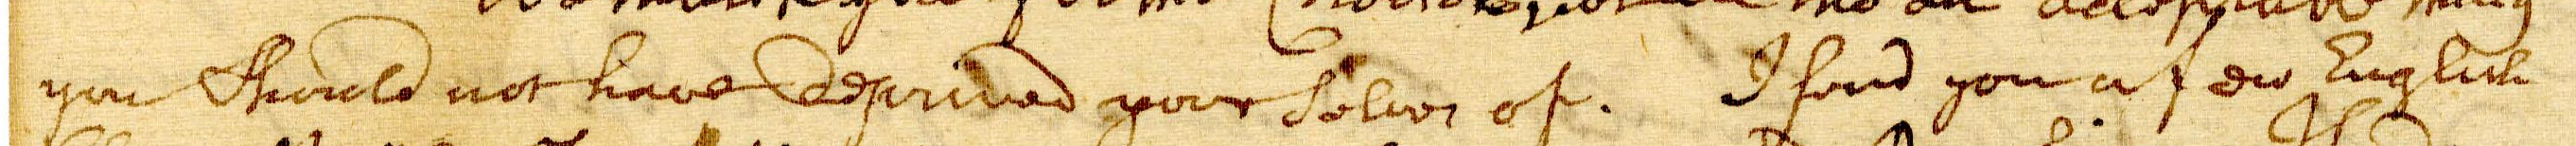you should not have deprived your Selves of. I send you a few English
